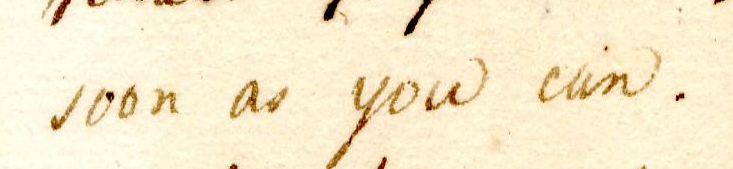soon as you can.
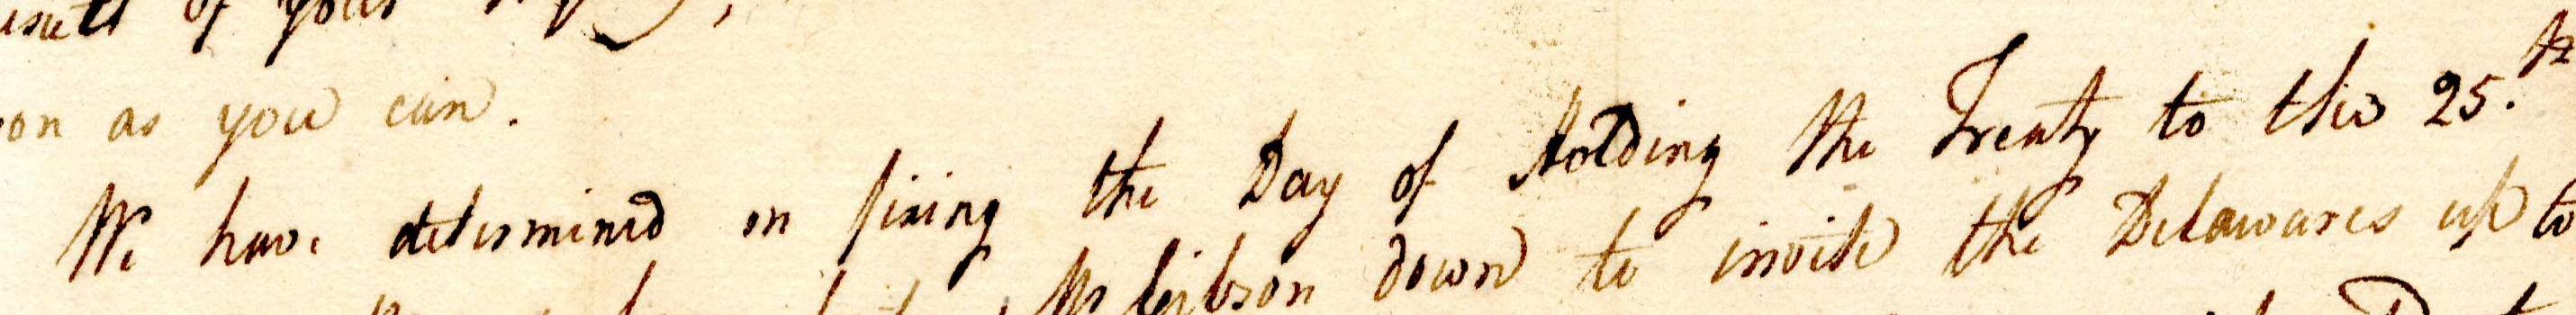We have determined in fixing the Day of Holding the Treaty to the 25^th.
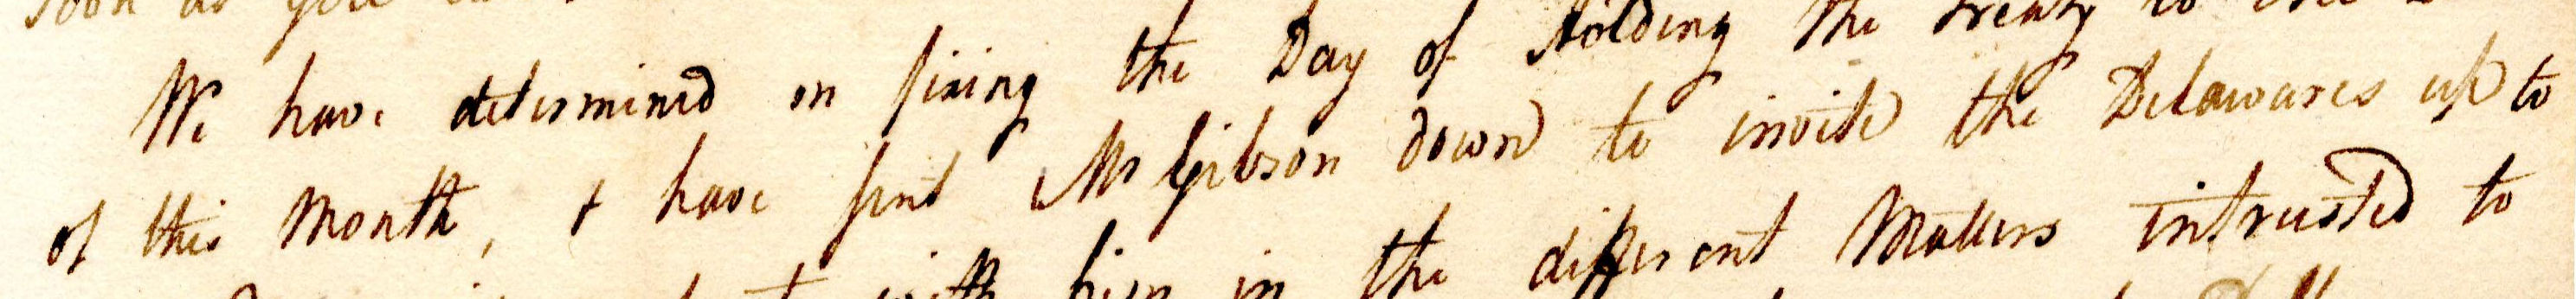of this month, & have Sent M^r Gibson down to invite the Delawares up to
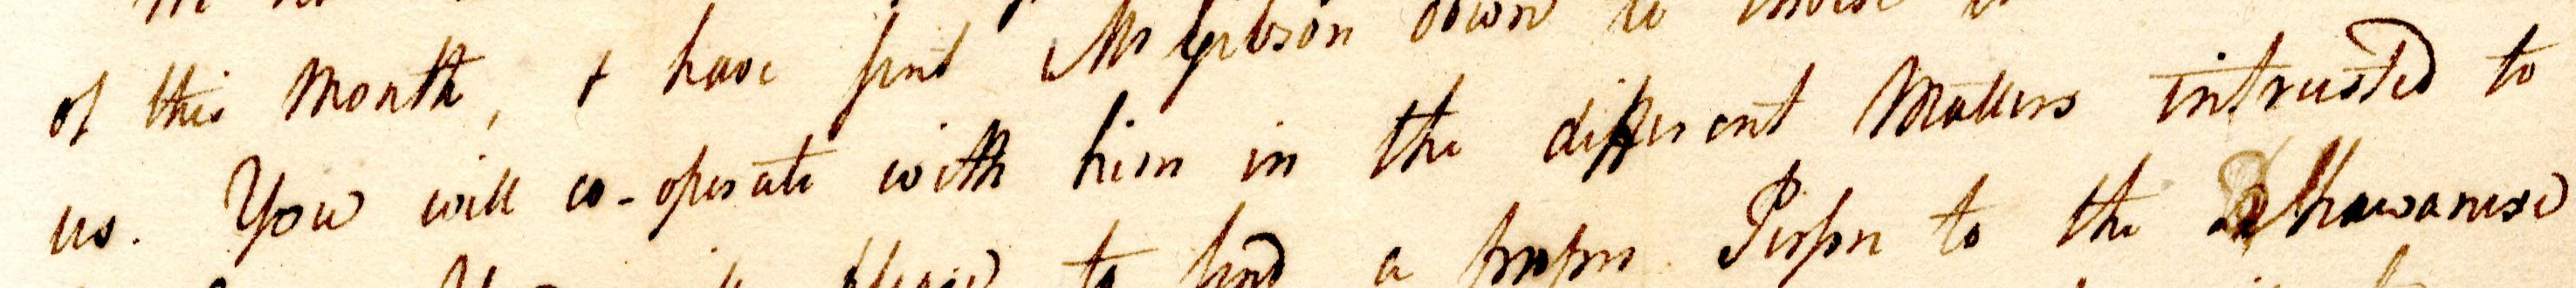us. You will co-operate with him in the different Matters intrusted to
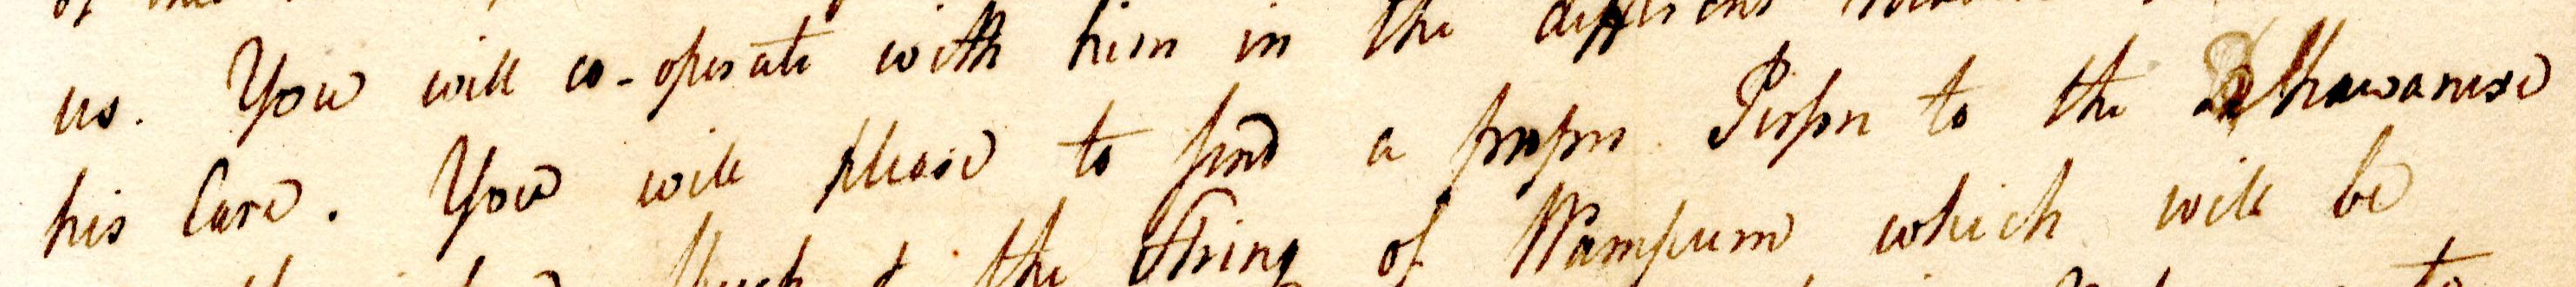his Care. You will please to find a proper Person to the Shawanese
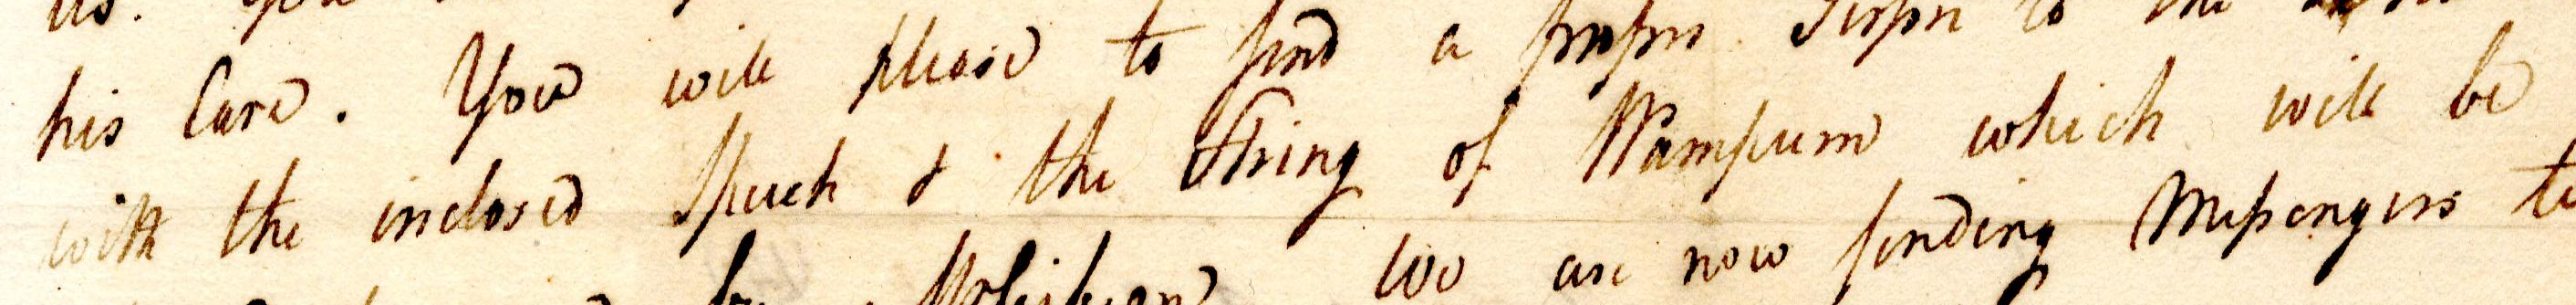with the inclosed speech & the String of Wampum which will be
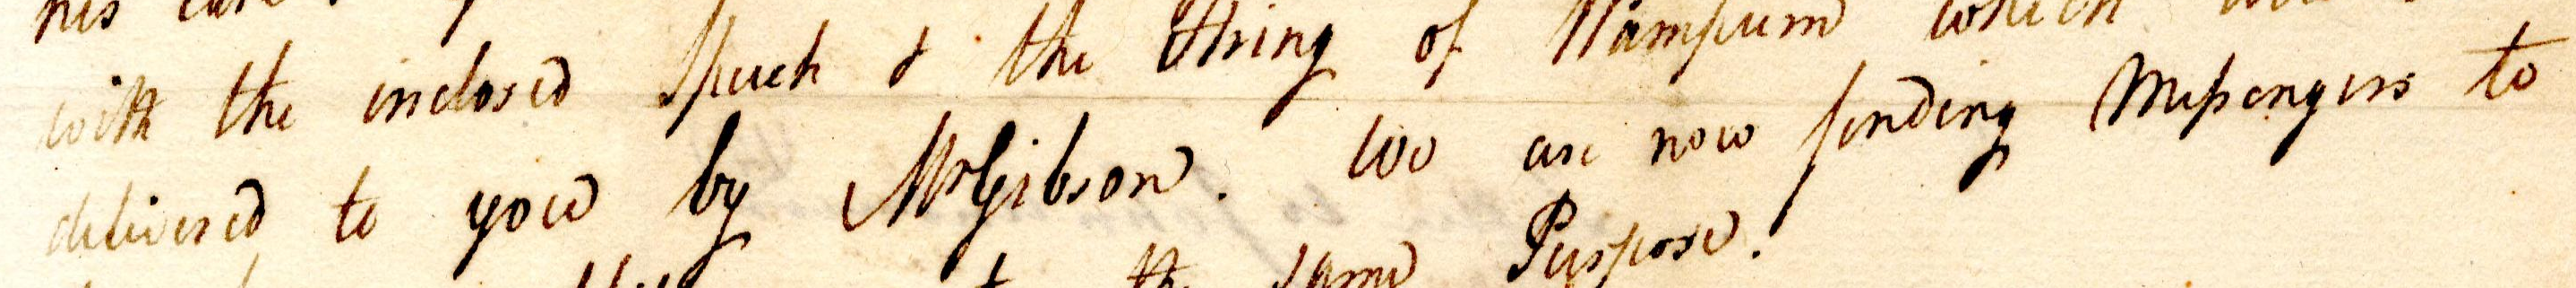delivered to you by M^r Gibson. We are now finding messengers to
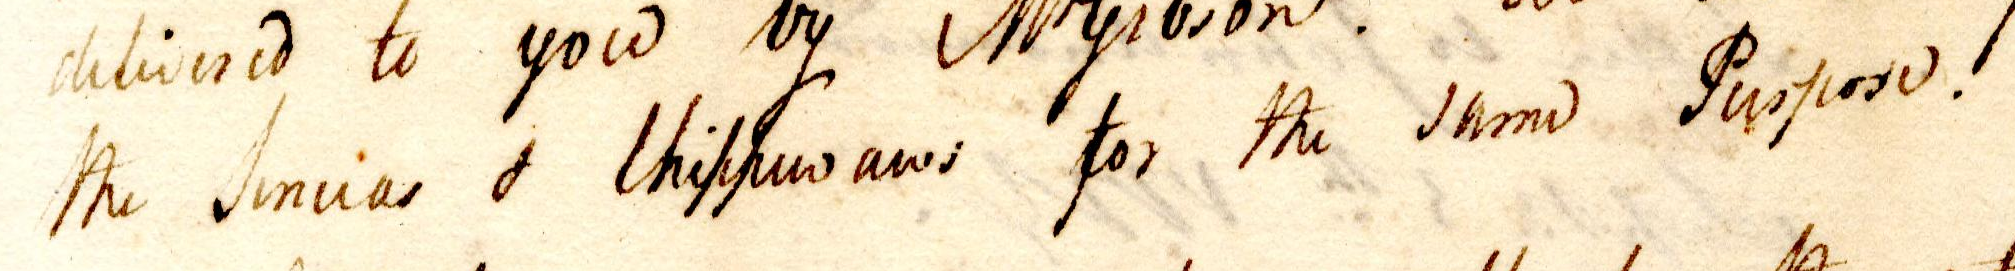the Senecas & Chippawaws for the same Purpose.
